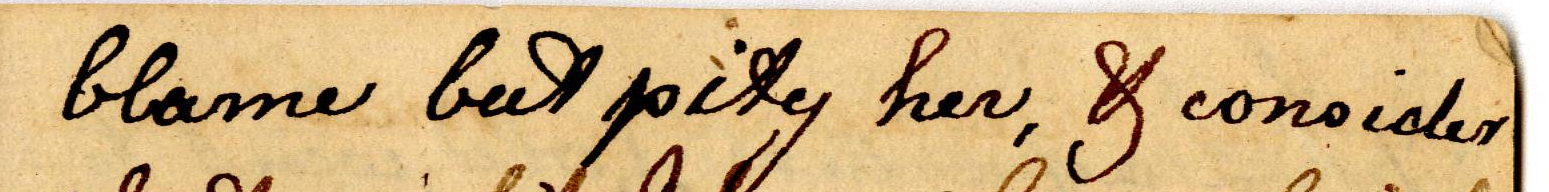blame but pity her, & consider
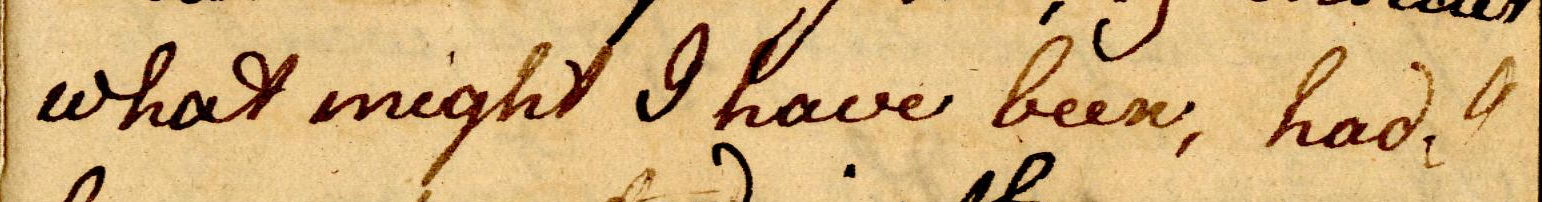what might I have been, had I
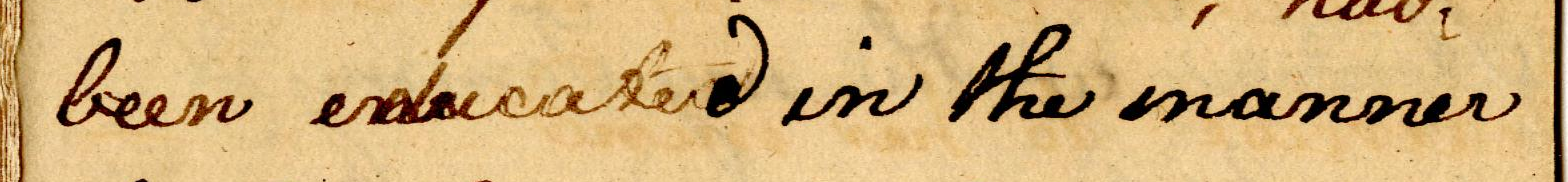been educated in the manner
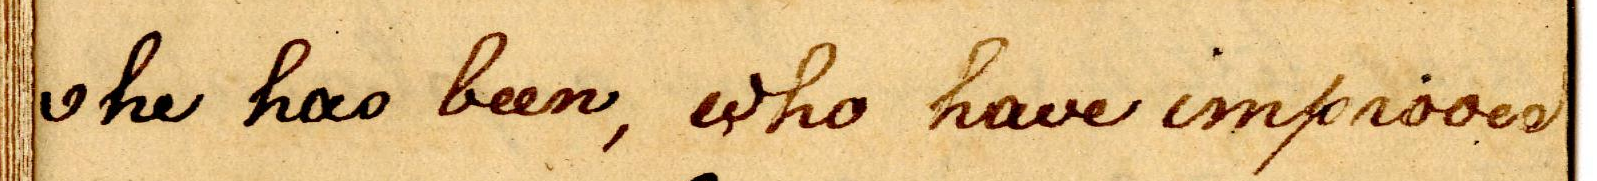she has been, who have improved
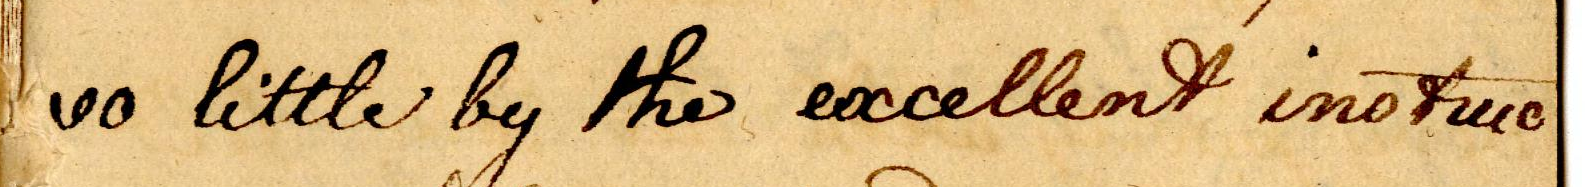so little by the excellent instruc
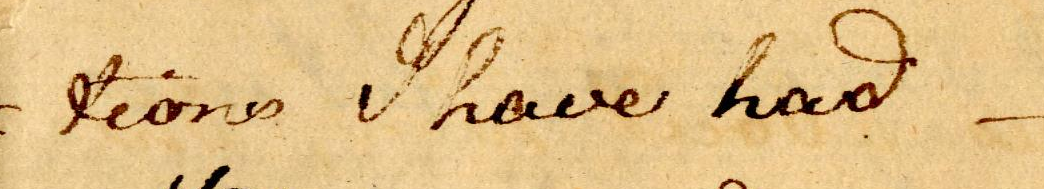-tions I have had-
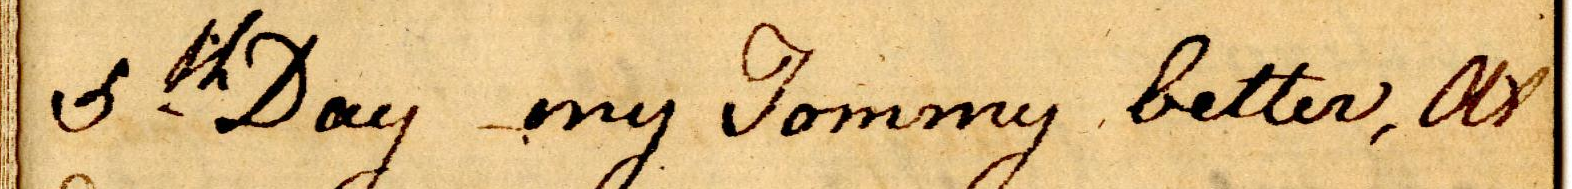5^th Day- my Tommy better, At
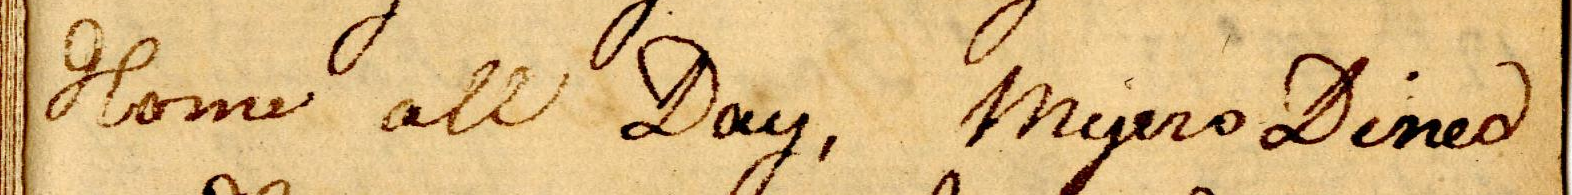Home all Day, Myers Dined
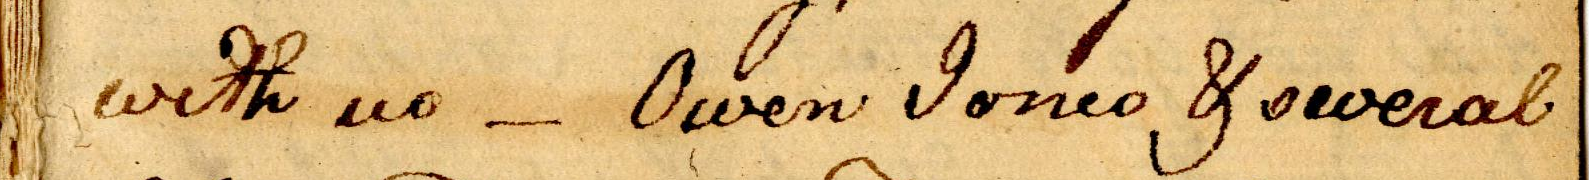with us- Owen Jones, & several
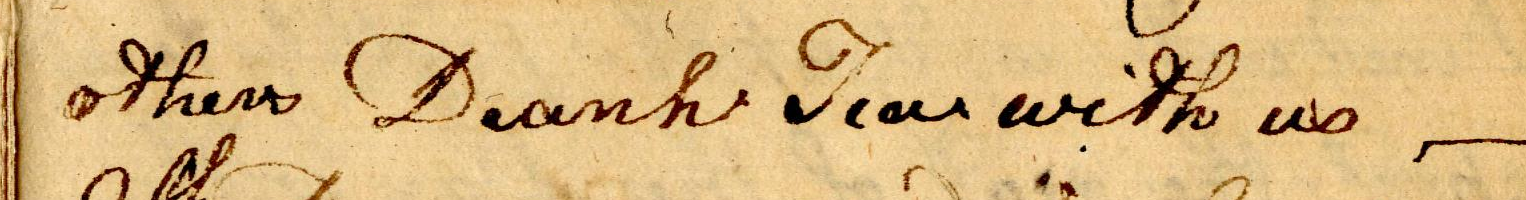others Drank Tea with us-
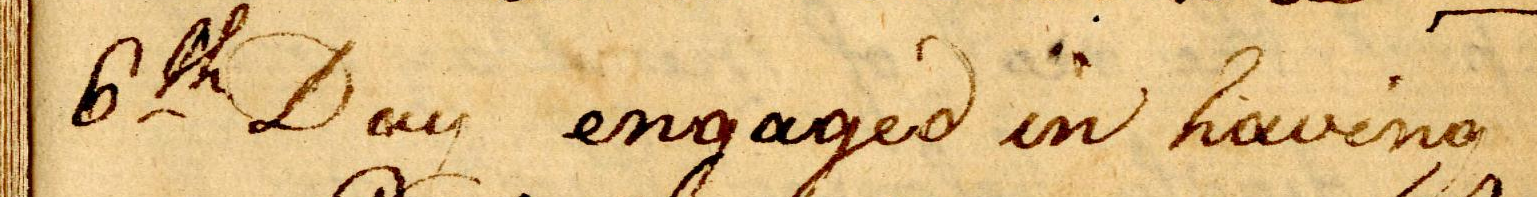6^th Day. engaged in having
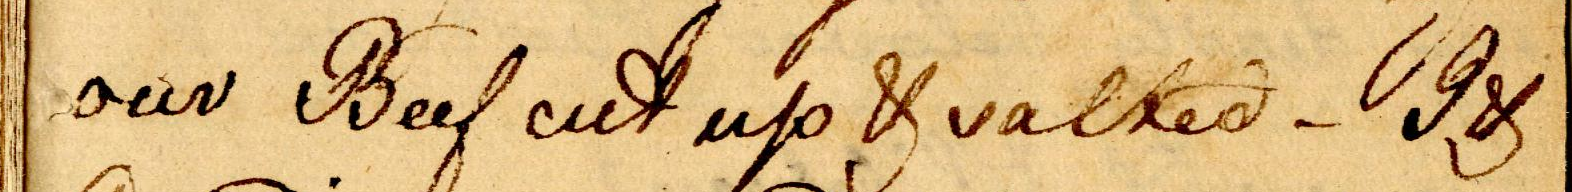our Beef cut up & salked- I&
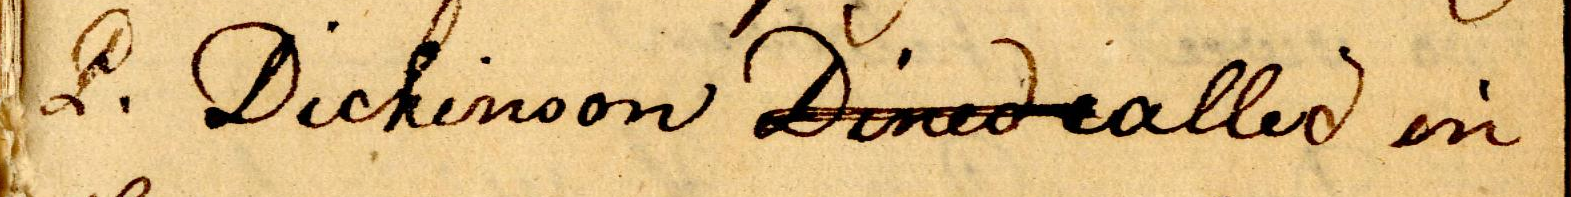P. Dickinson [Dined] called in
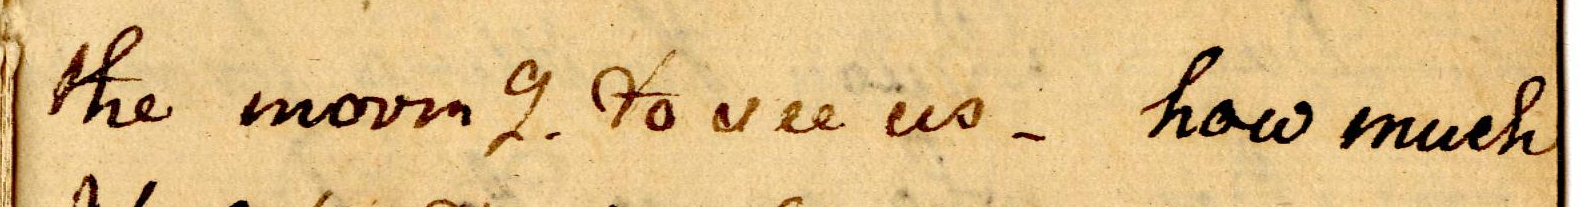the morn^g to see us- how much
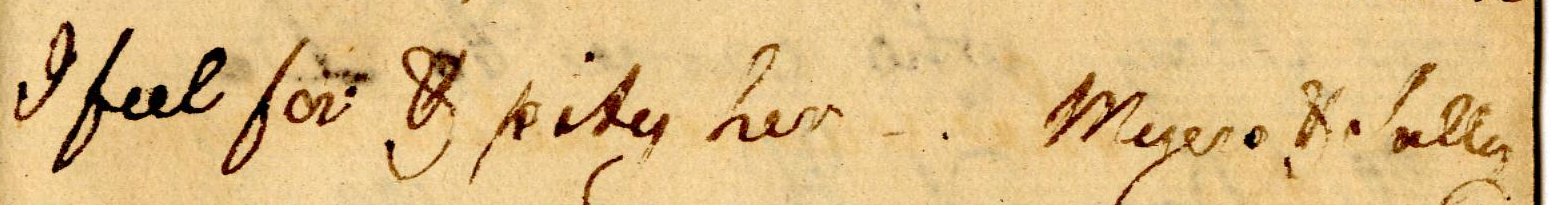feel for & pity her-. Myers & Sally
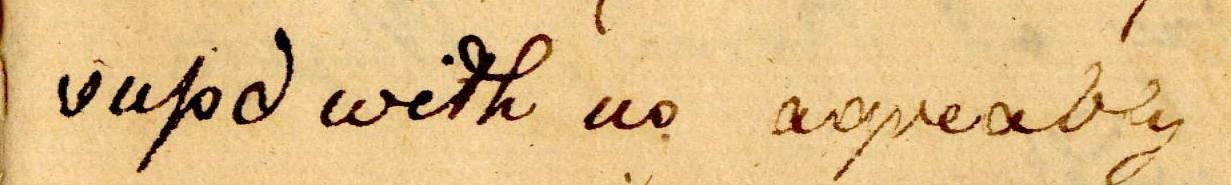supd with us agreably
